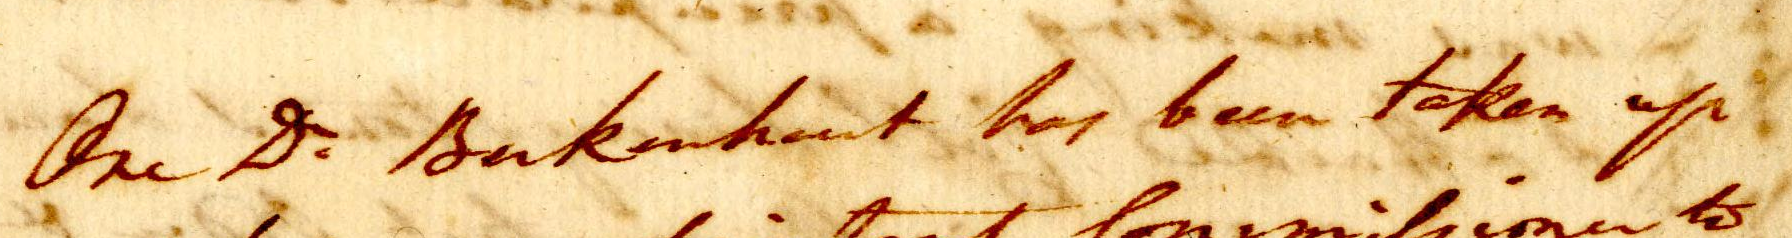One D. Bakenhout has been taken up
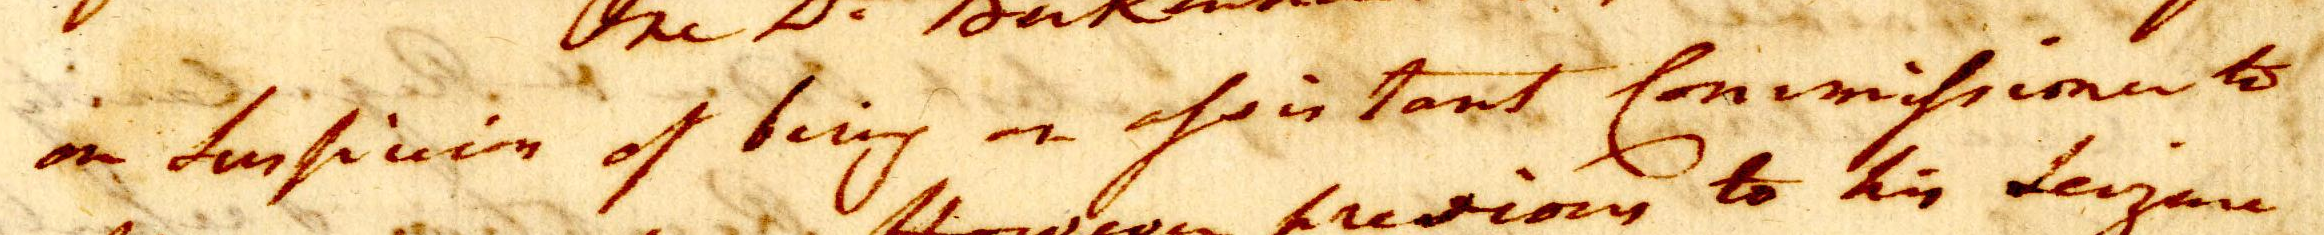on Suspicion of being an assistant Commissionate
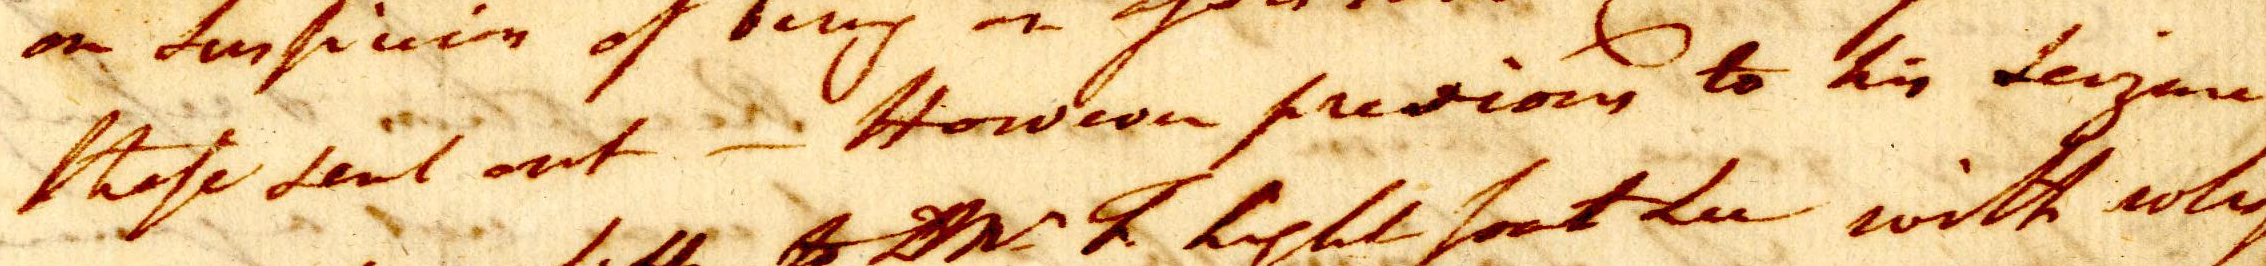State sent out. However previous to his Leizure
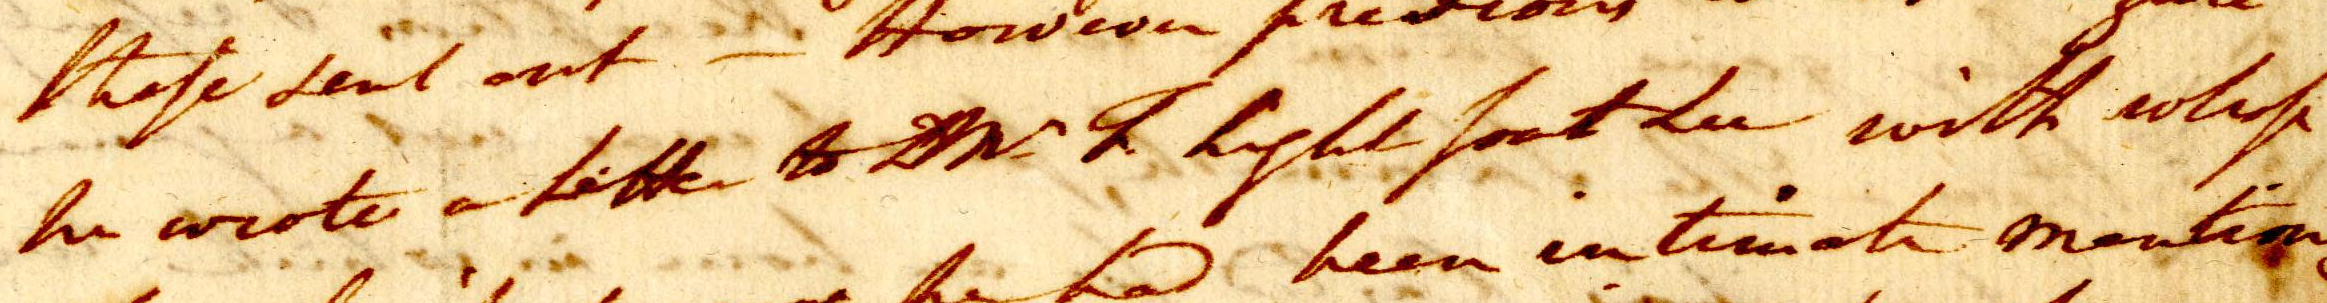he wrote a Letter to D.W. L. Light Fort Lee with whose
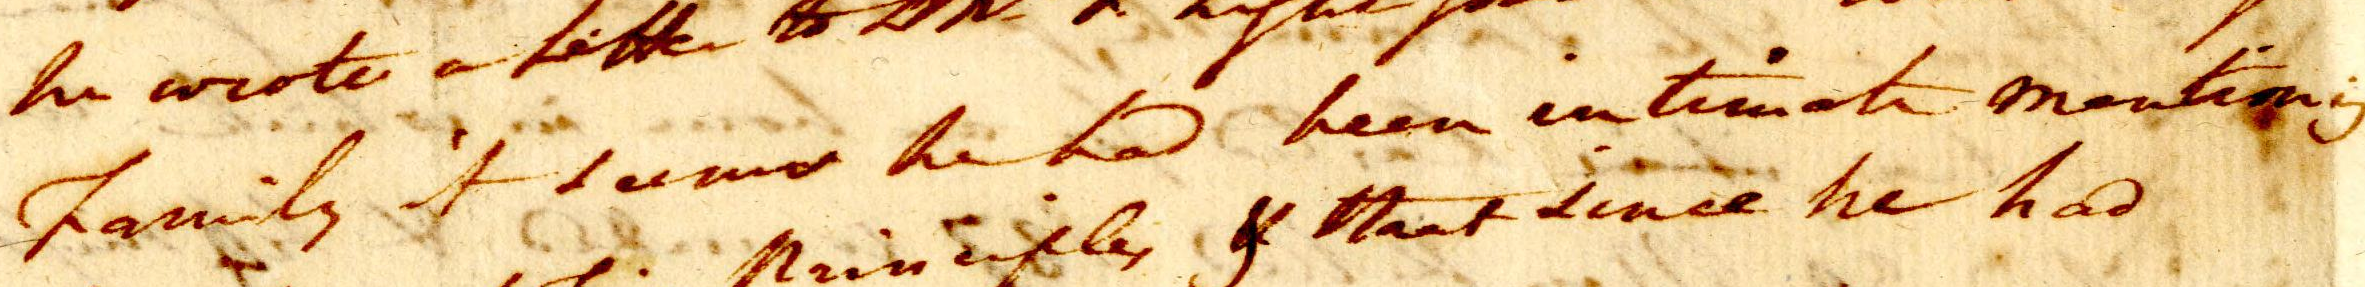family it seems he had been intimate mouting
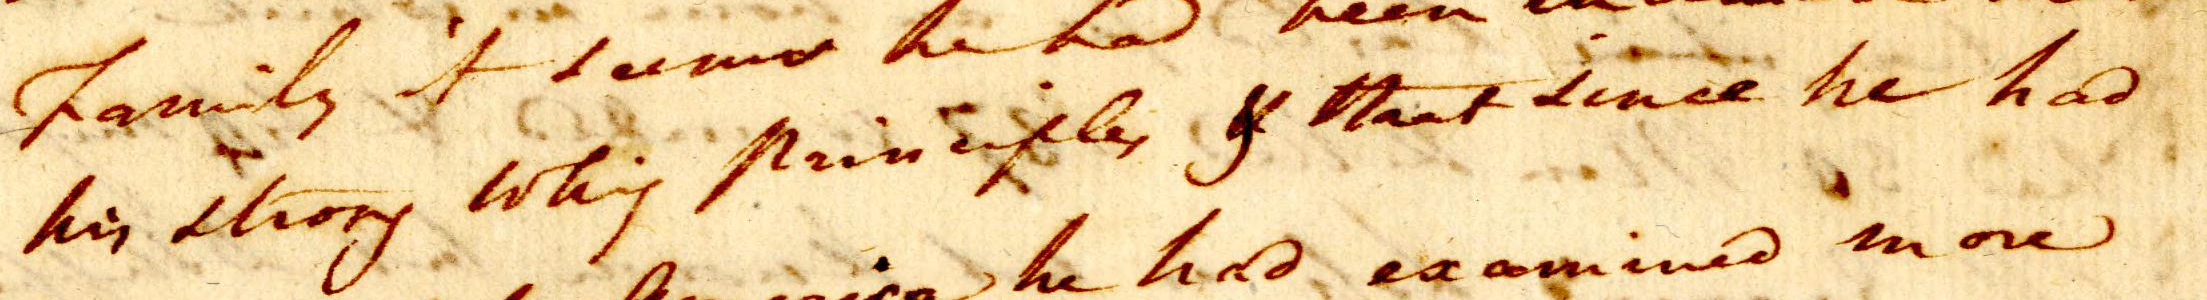his story why principles & that since he had
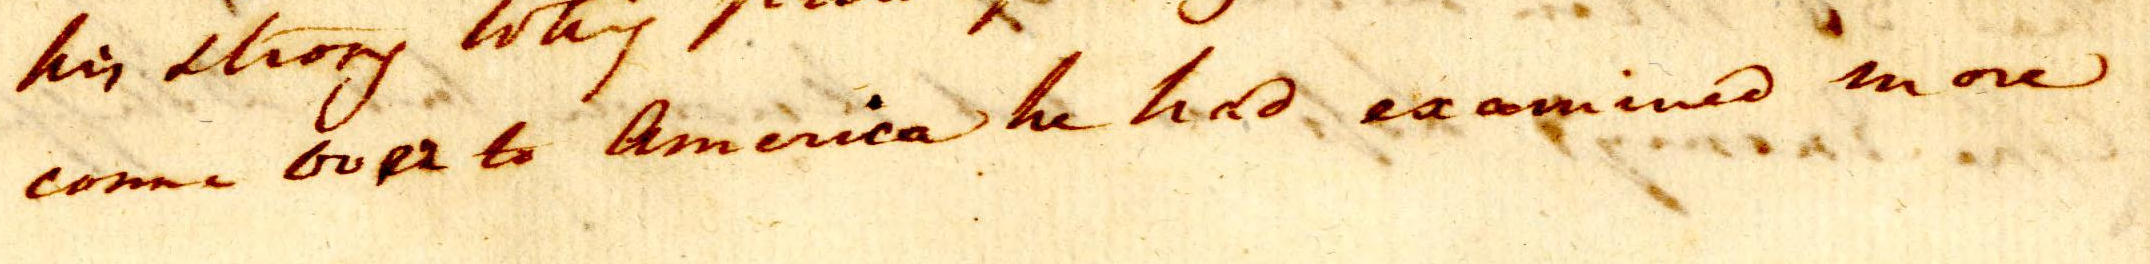come over to America he had examined in one
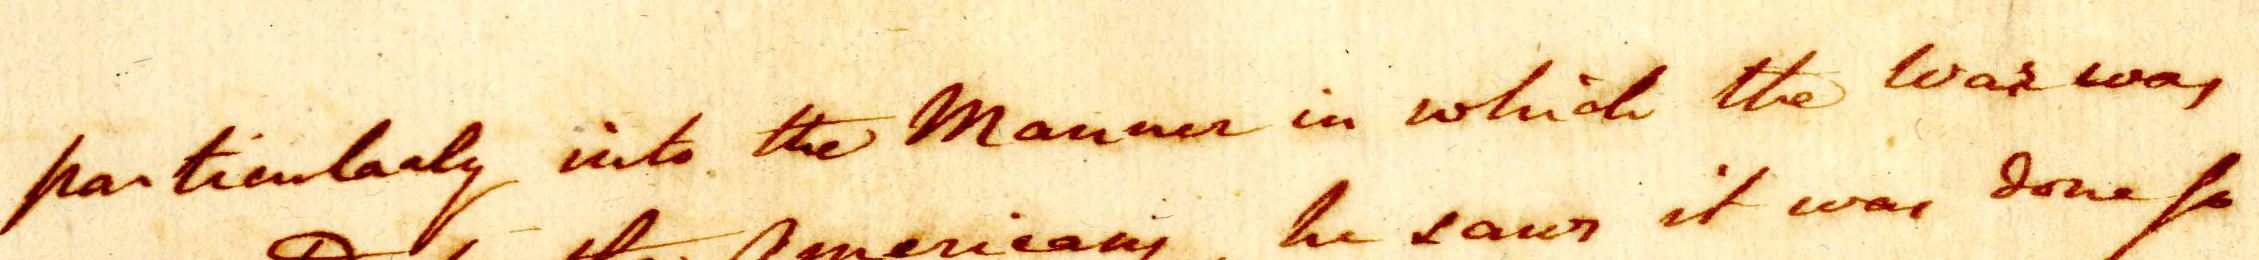particularty into the Manner in which the War was
